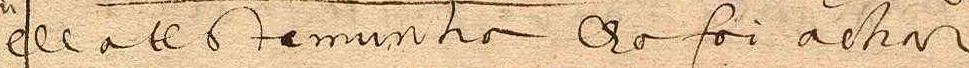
ella testemunha lha foi achar
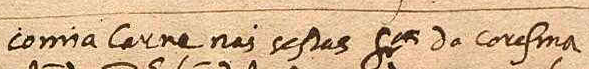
comia Carne nas sestas fras da coresma
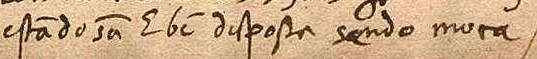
estādo sā E bē desposta sendo moça /
